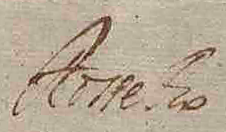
A este fis
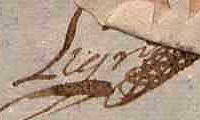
Ligro
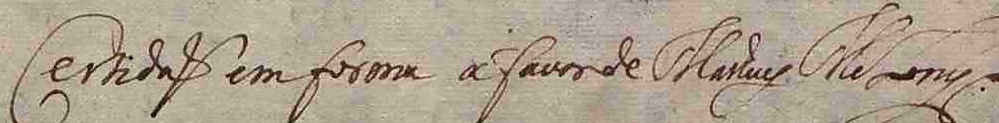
Certidaõ em forma a favor de Matheus MeLony.
